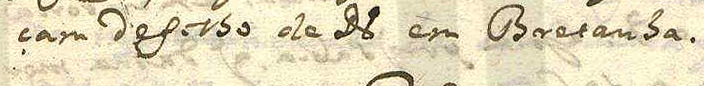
çam de filho de Ds em Bretanha.
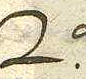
2.a
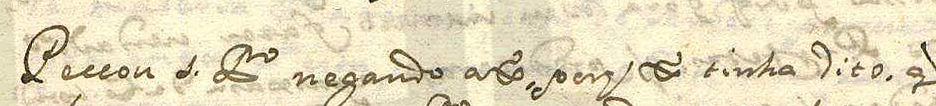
Peccou s. Po negando a xo, porq̄ & tinha dito. q̄
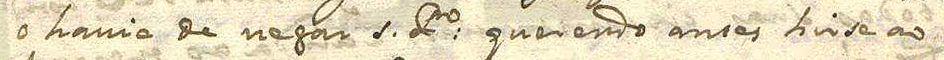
o hauia de negar s. Po: querendo antes hirse ao
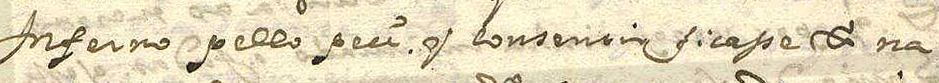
Jnferno pello pecc̄ q̄ consentir ficasse & na
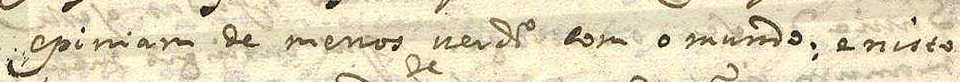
opiniam de menos uerdro com o mundo; e nisto
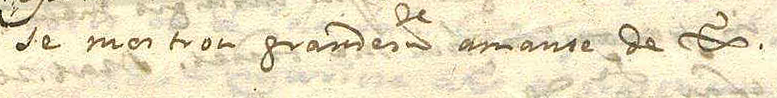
se mostrou grandemte amante de Xo.
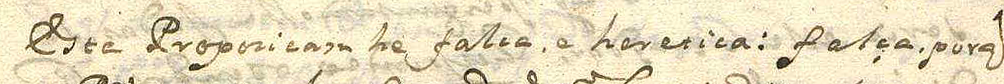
Esta Propoziçam he falça, e heretica: falça; porq̄
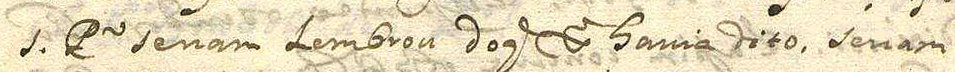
s. Po senam Lembrou do q̄ xo hauia dito, senam
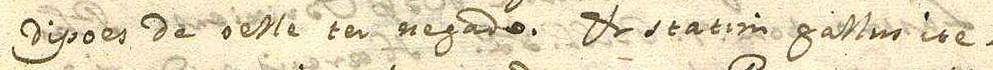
dipoes de o elle ter negado. & statim gallus ite
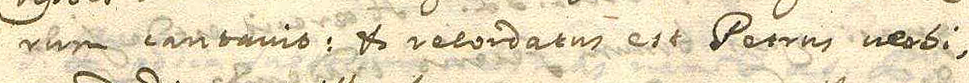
rum cantauit: & recordatus est Petrus uerbi,
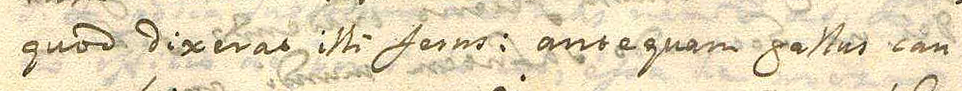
quod dixerat illi Jesus: antequam gallus can
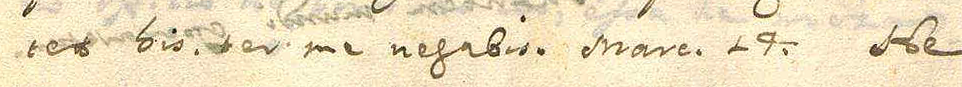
tet bis. ter me negabis. marc. 14. He
